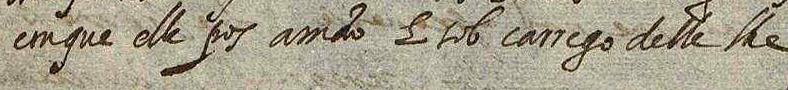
em que elle pos a mão E sob carrego delle lhe
